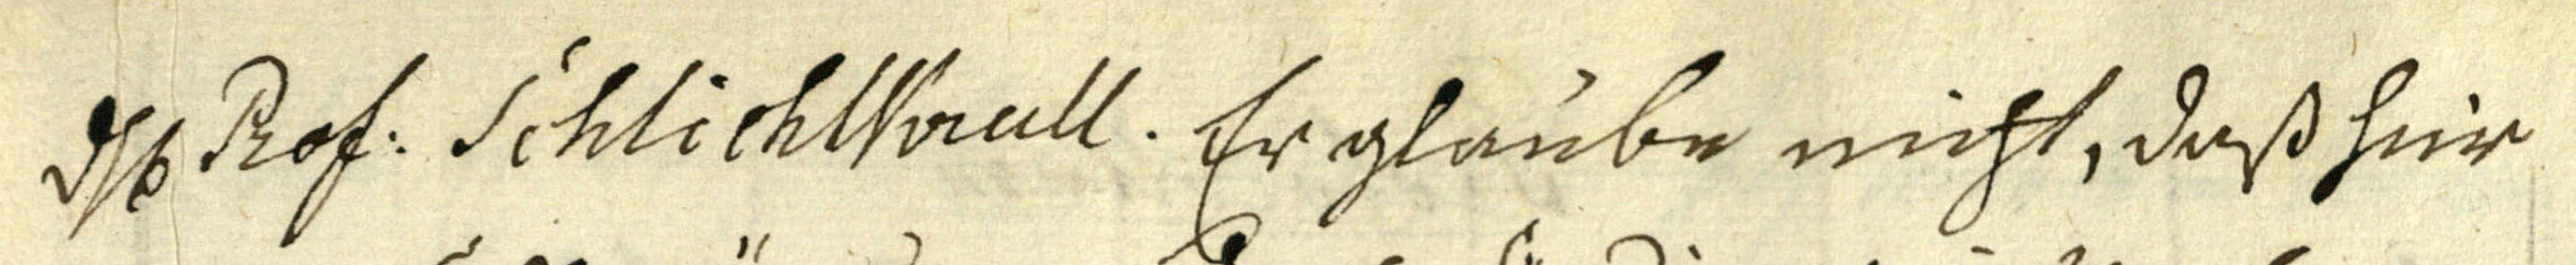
dh Prof. Schlichtkrull. Er glaube nicht, daß hier
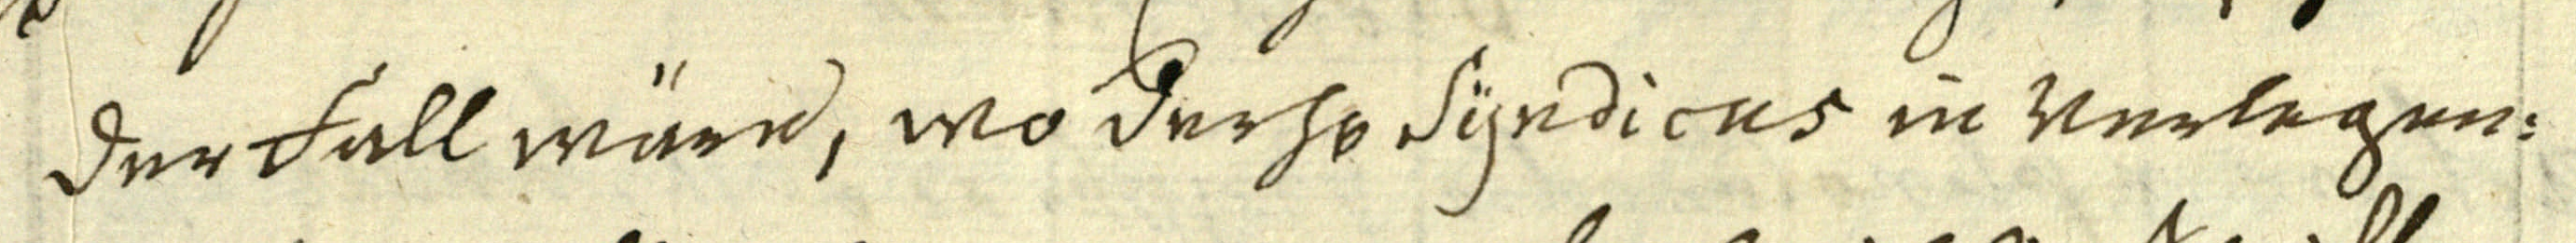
der Fall wäre, wo der h Sÿndicus in Verlegen¬
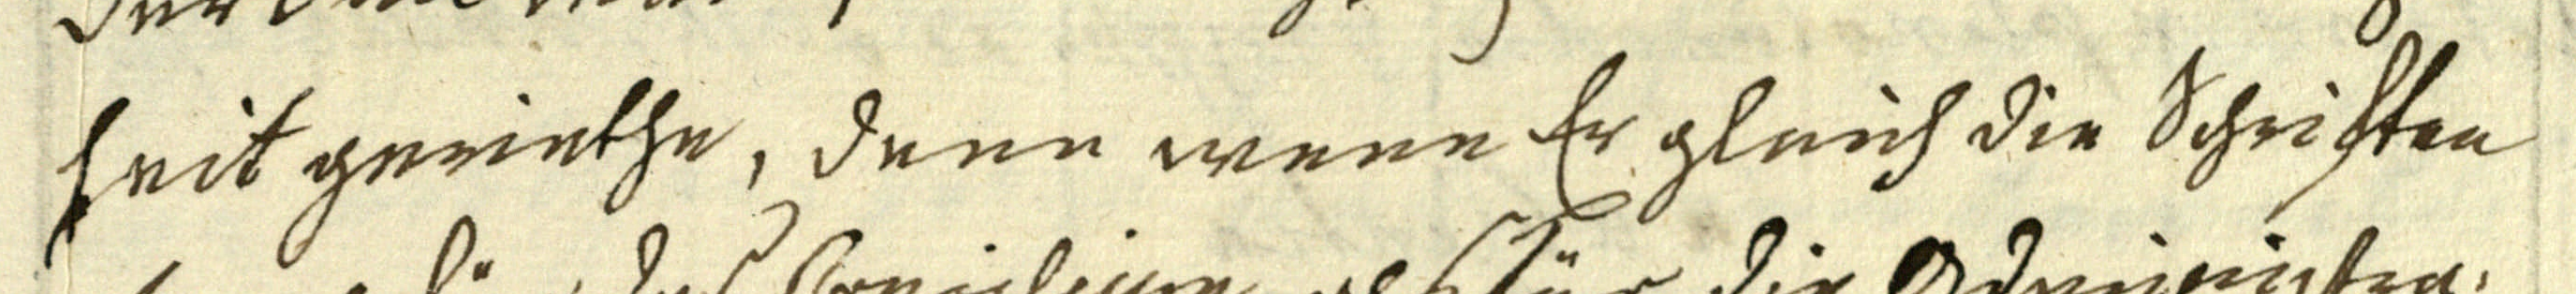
heit geriethe, denn wenn Er gleich die Schriften
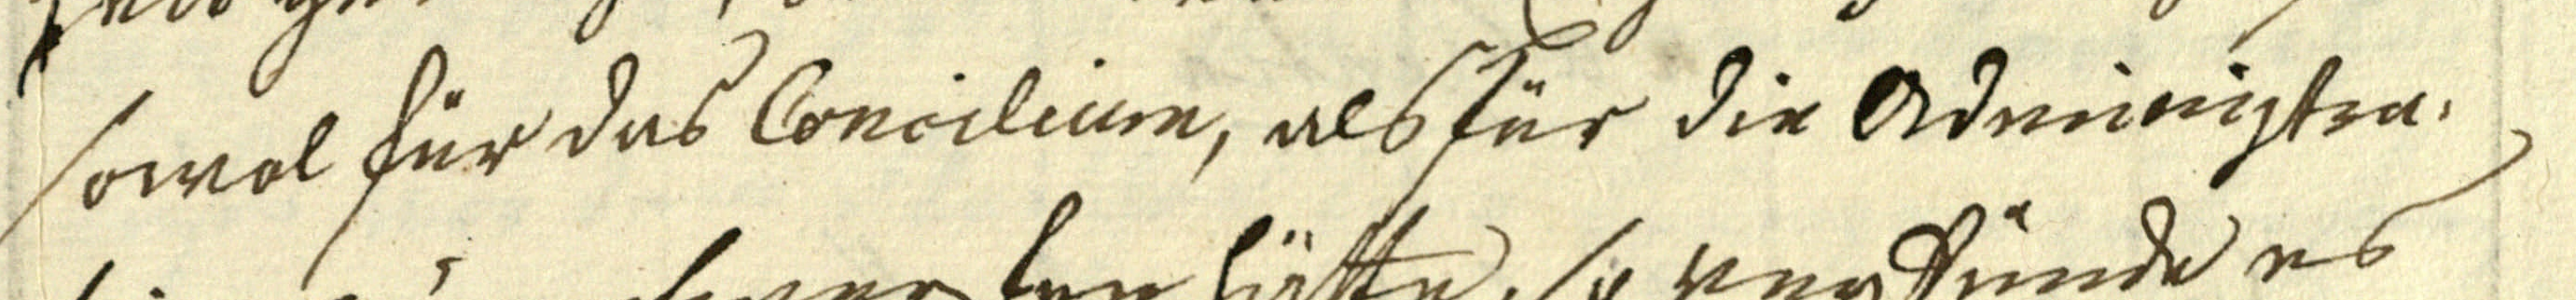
sowol für das Concilium, als für die Administra¬
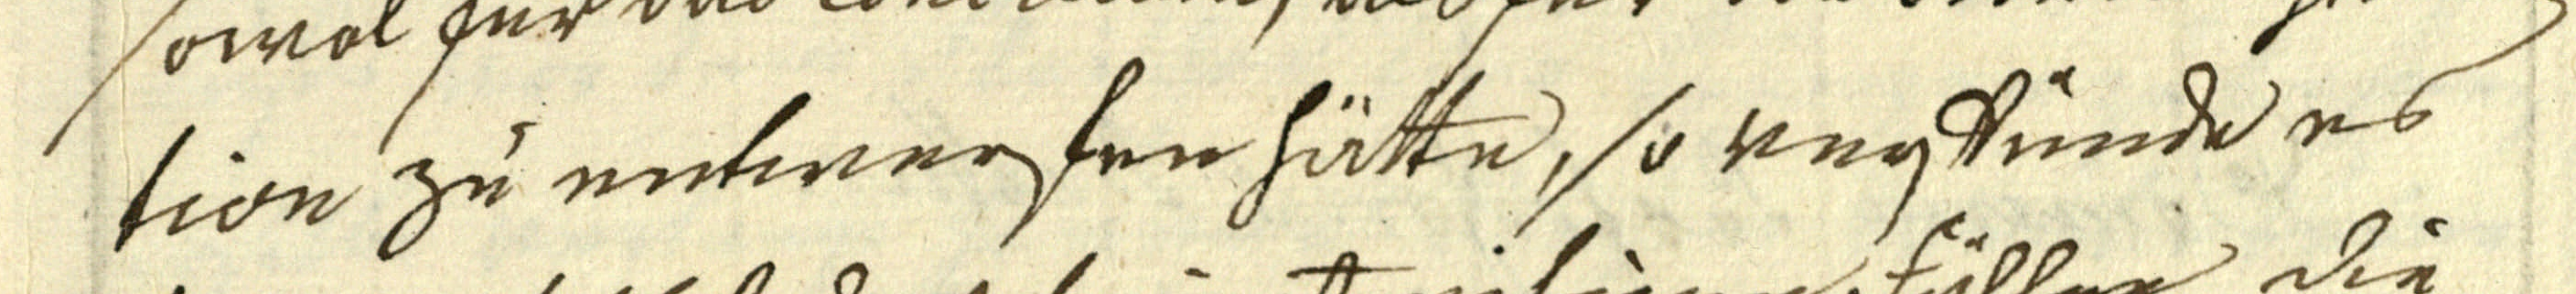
tion zu entwerfen hätte, so verstünde es
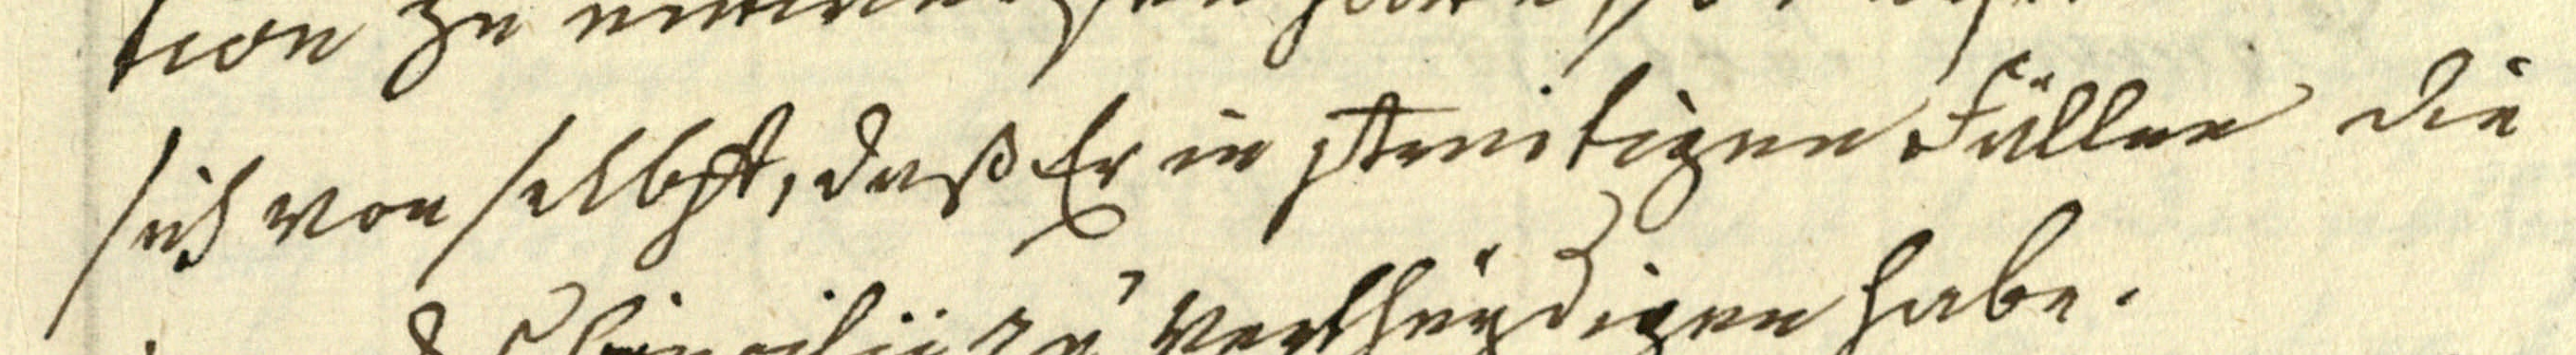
sich von selbst, daß Er in streitigen Fällen die
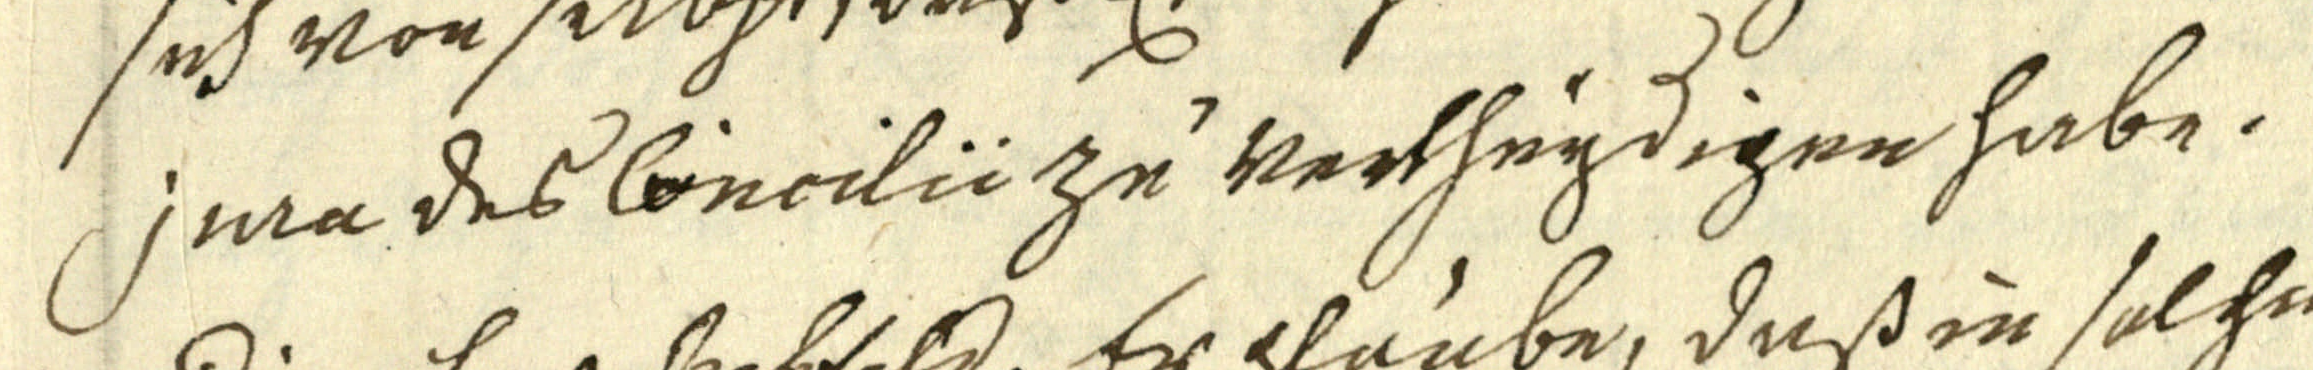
jura des Concilii zu vertheÿdigen habe.
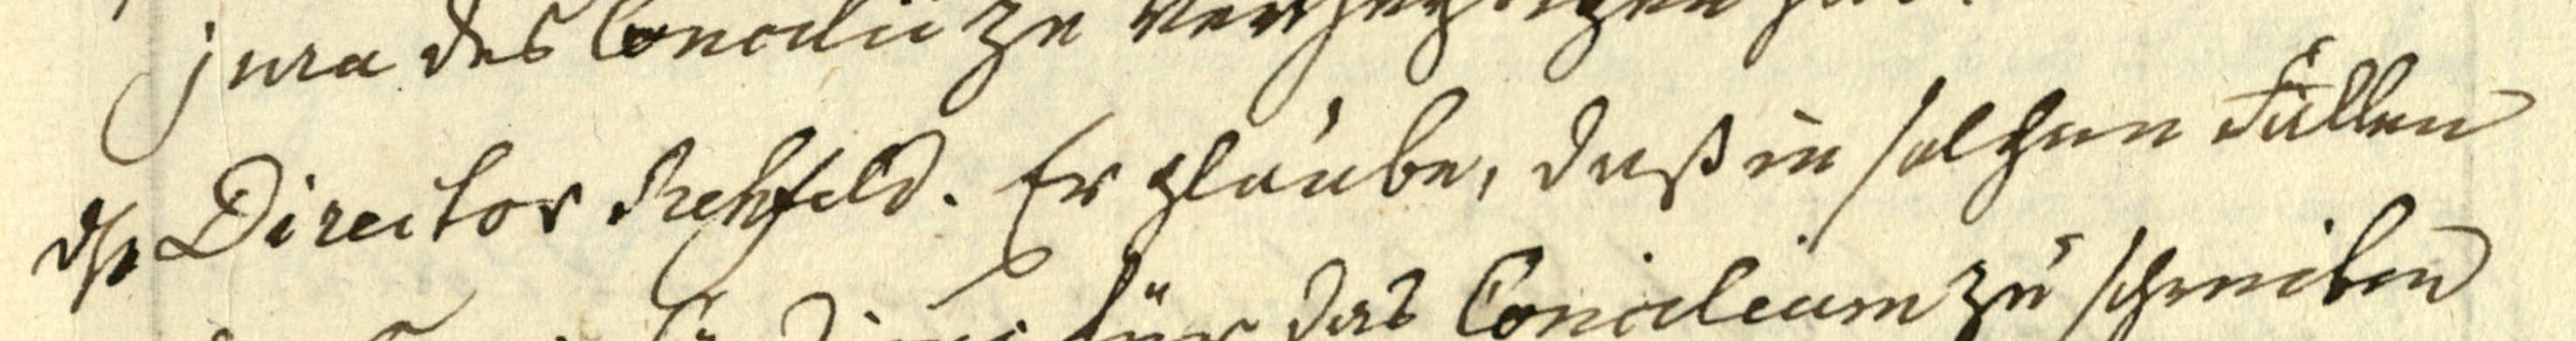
dh. Director Rehfeld. Er glaube, daß in solchen Fällen
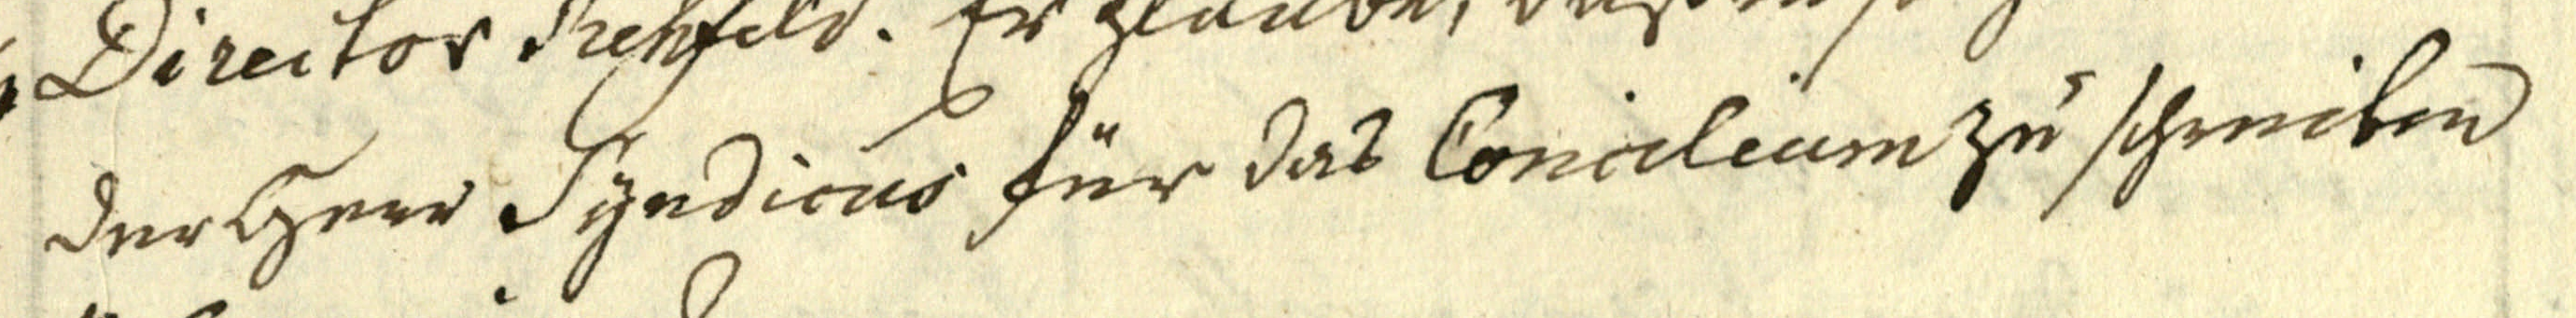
der Herr Sÿndicus für das Concilium zu schreiben
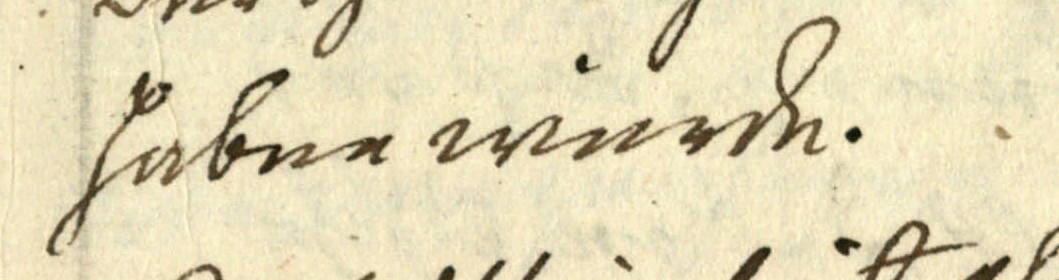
haben würde.
